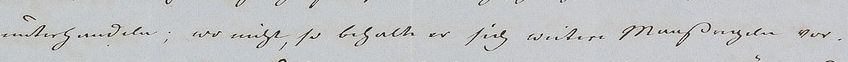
unterhandeln; wo nicht, so behalte er sich weitere Maaßregeln vor.
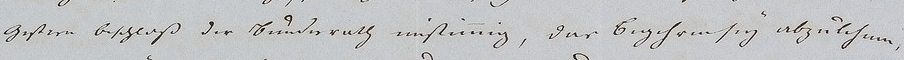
Gestern beschloß der Bundesrath einstimmig, das Begehren sey abzulehnen,
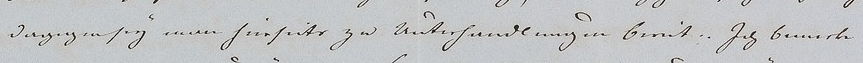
dagegen sey man hierseits zu Unterhandlungen bereit. Ich bemerke
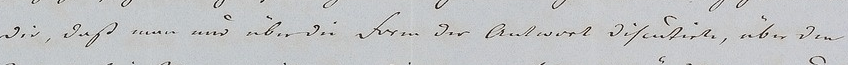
Dir, daß man nur über die Form der Antwort discutirte, über den
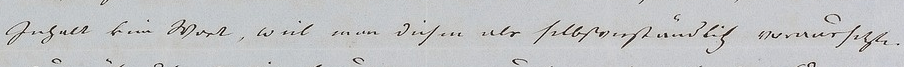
Inhalt kein Wort, weil man diesen als selbstverständlich voraussetzte.
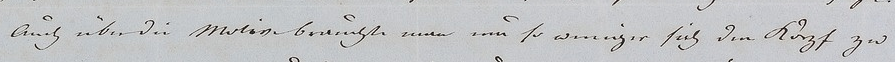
Auch über die Motive brauchte man um so weniger sich den Kopf zu
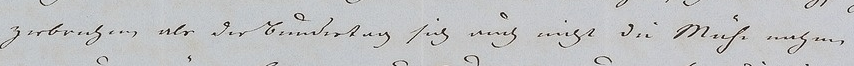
zerbrechen, als der Bundestag sich auch nicht die Mühe nahm,
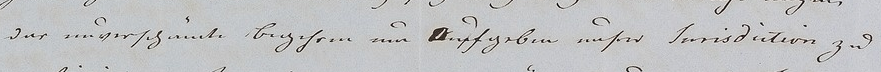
das unverschämte Begehren um Aufgeben unsrer Iurisdiction zu
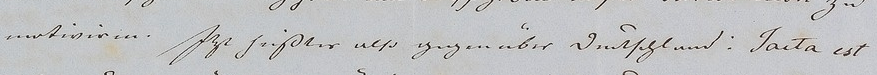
motiviren. Jetzt heißt es also gegenüber Deutschland: Iacta est
